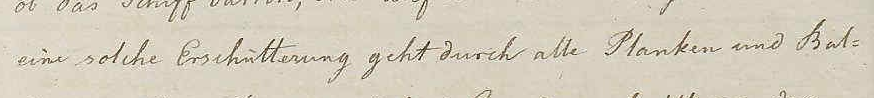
eine solche Erschütterung geht durch alle Planken und Bal-
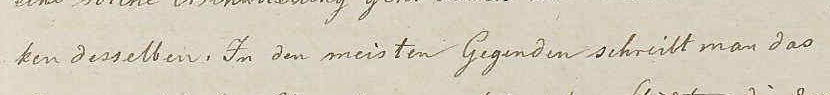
ken desselben. In den meisten Gegenden schreibt man das
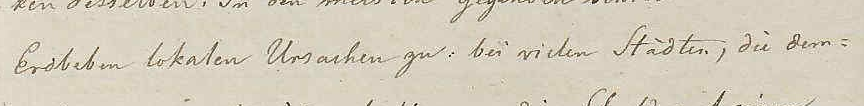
Erdbeben lokalen Ursachen zu: bei vielen Städten, die dem-
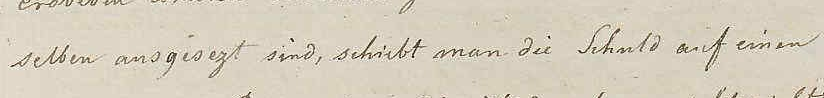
selben ausgesezt sind, schiebt man die Schuld auf einen
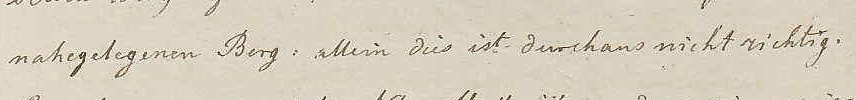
nahegelegenen Berg: allein dies ist durchaus nicht richtig.
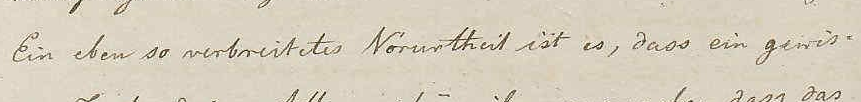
Ein eben so verbreitetes Vorurtheil ist es, dass ein gewis-
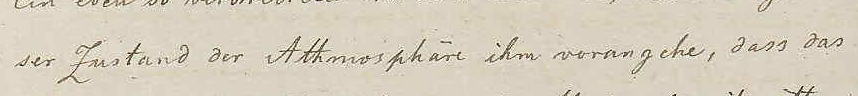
ser Zustand der Athmosphäre ihm vorangehe, dass das
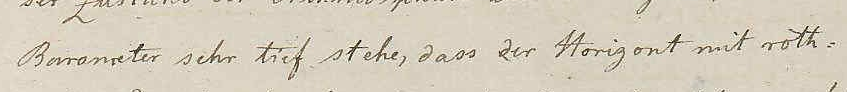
Barometer sehr tief stehe, dass der Horizont mit röth-
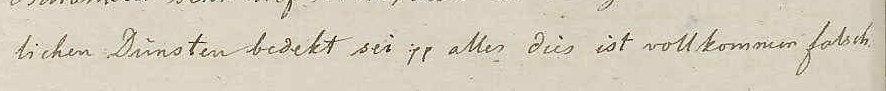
lichen Dünsten bedekt sei alles dies ist vollkommen falsch.
